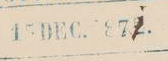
15 Decbr. 1871.
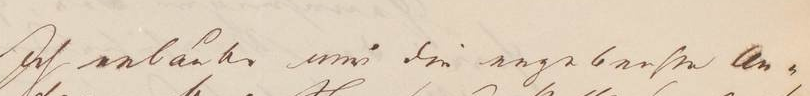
Ich erlaube mir die ergebenste An-
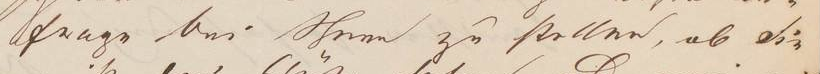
frage bei Ihnen zu stellen, ob Sie
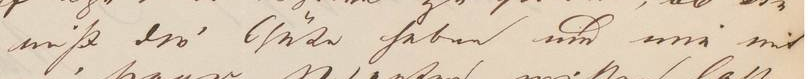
nicht die Güte haben und mir mit
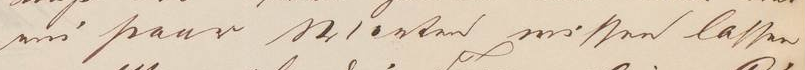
ein paar Worten wissen lassen
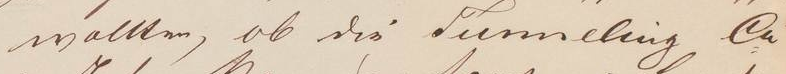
wollten, ob die Tunneling Cie
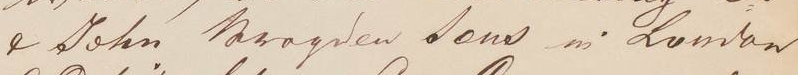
& John Brogden Sons in London
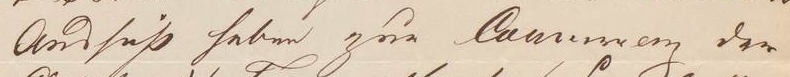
Aussicht haben zur Concurrenz der
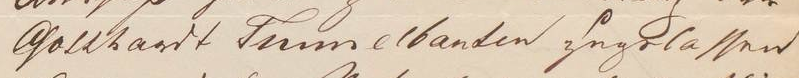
Gotthardt Tunnelbauten zugelassen
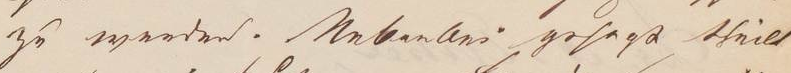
zu werden. Nebenbei gesagt theilt
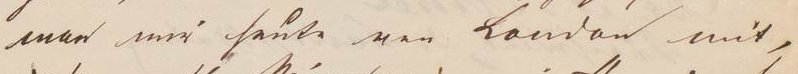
man mir heute von London mit,
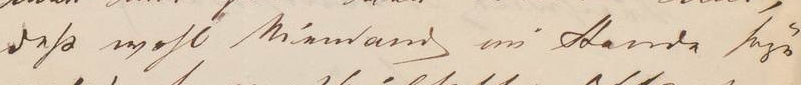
daß wohl Niemand im Stande seyn
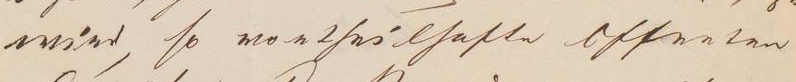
wird so vortheilhafte Offerten
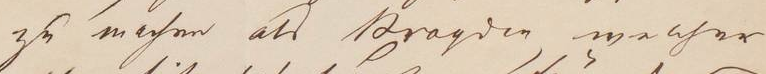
zu machen als Brogden, welcher
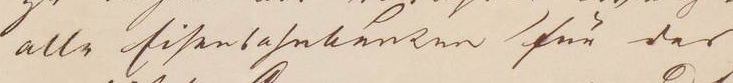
alle Eisenbahnbauten für das
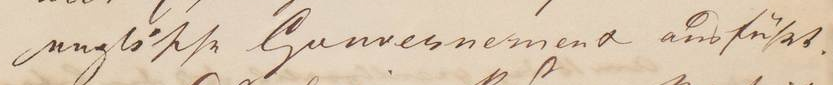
englische Gouvernement ausführt.
